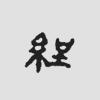{糸呈}
